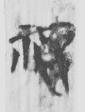禝
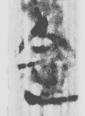定
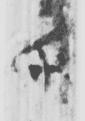氒
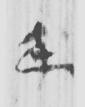身
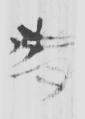脠
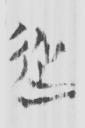﨤
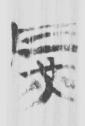庶
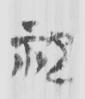祀
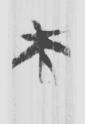夫
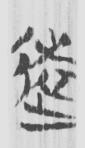遠
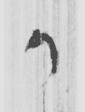人
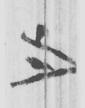之
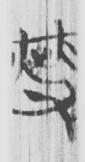{炎又}
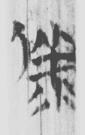備
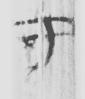于
